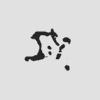攻
